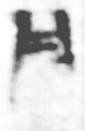凡
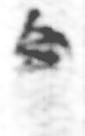宮
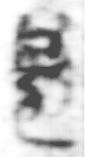廏
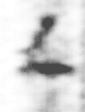之
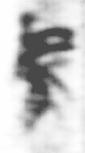馬
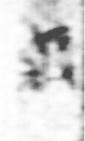與
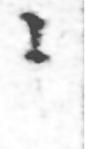十
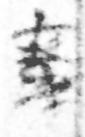𨍱（乘）
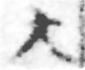入
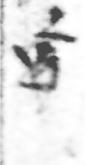此
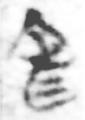官
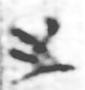之
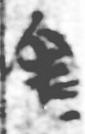○（中）
